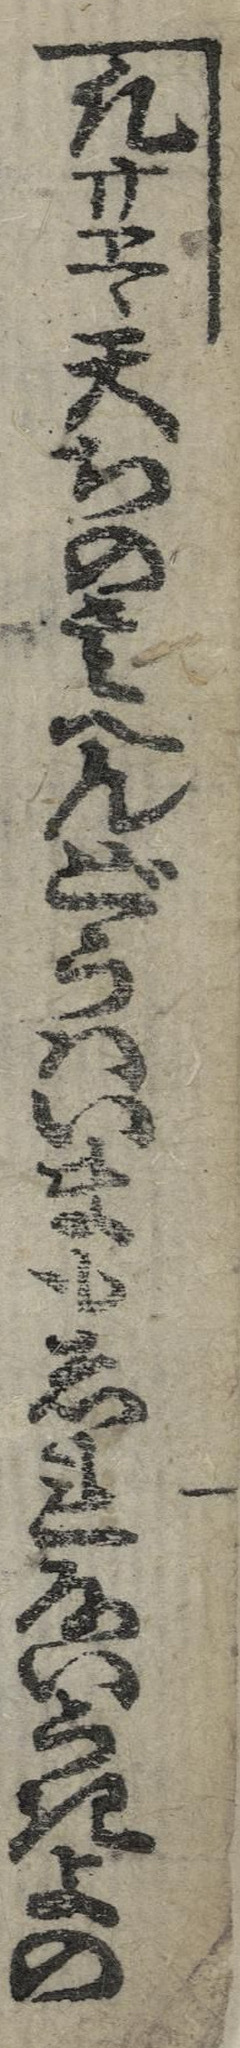〽凡サエ天ちの其へんどうはいまもしれないうきよの
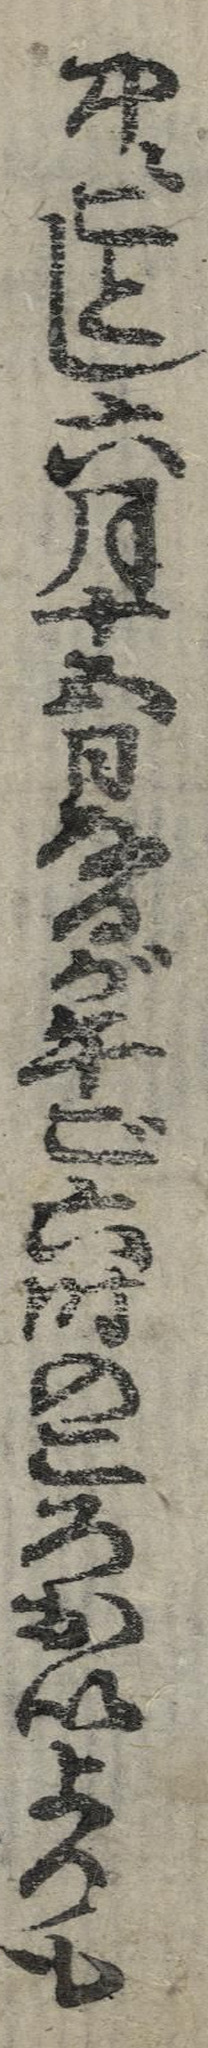中にことし六月十五日なるが午ご六時のころおいよりも
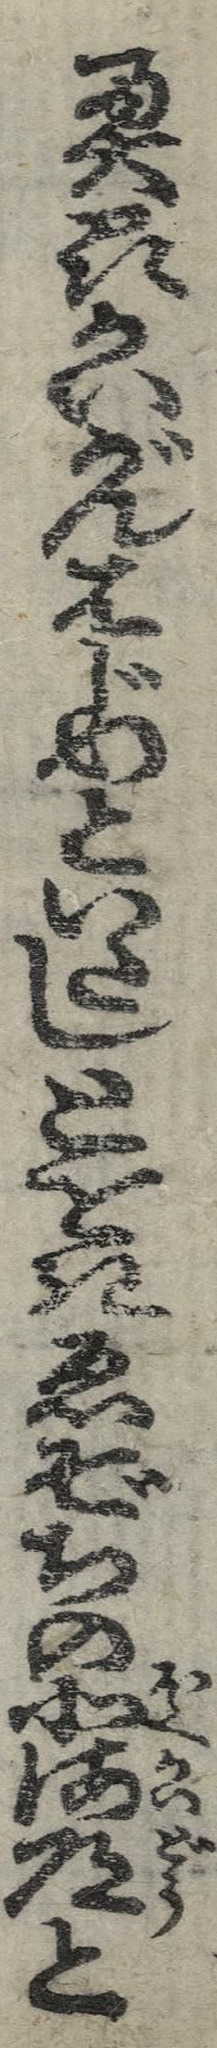奥州かいがんはじめといたしとをきゑぞちの北海道と
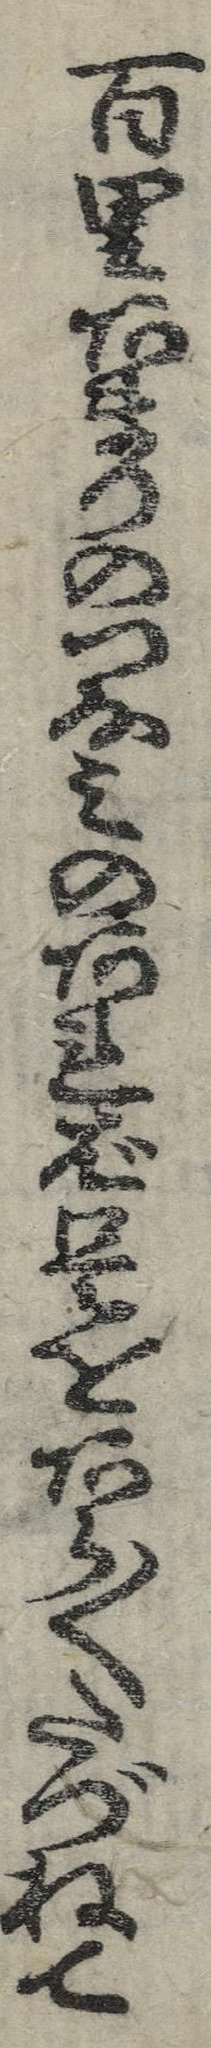百里あまりのつなみのあれば是をあら〳〵たづねて
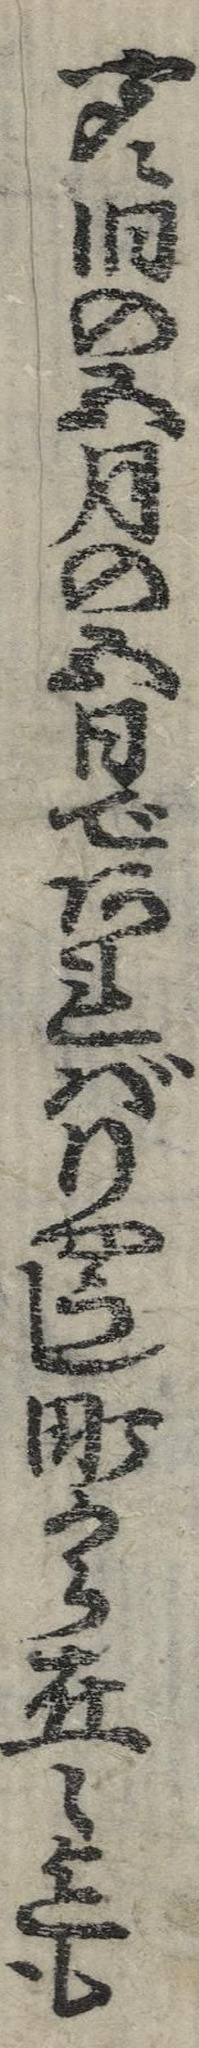聞に旧の五月の五日であればりやうし町から在々迄も
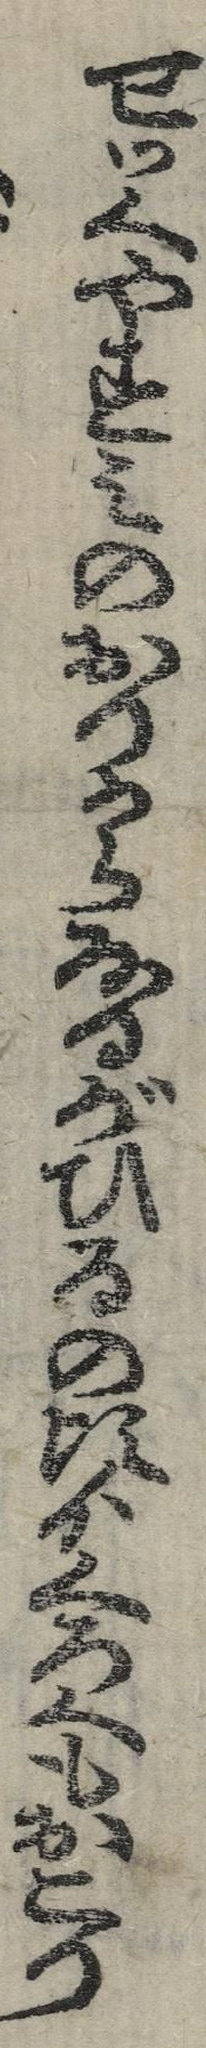せつくやすみのおりからなるがひるの頃ゟくろくもおこり
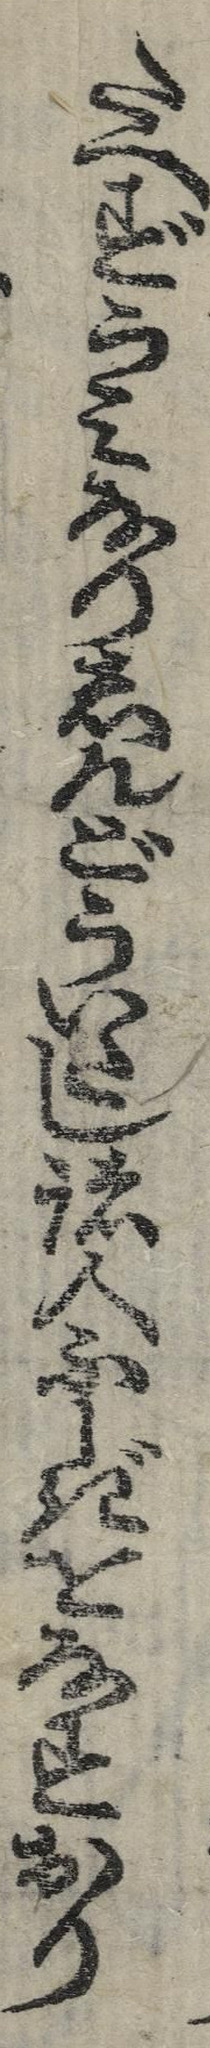たへずうみなりしんどういたし諸人ふしぎをなすおり
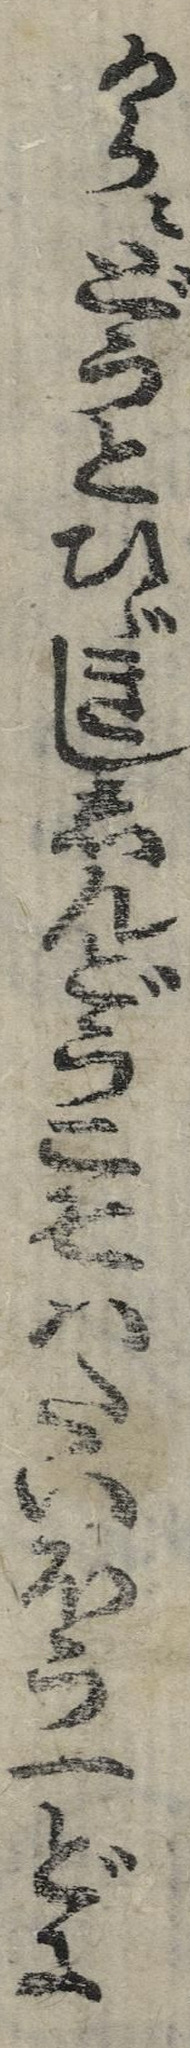からにどうとひゞきししんどうこそはたいほう一どに
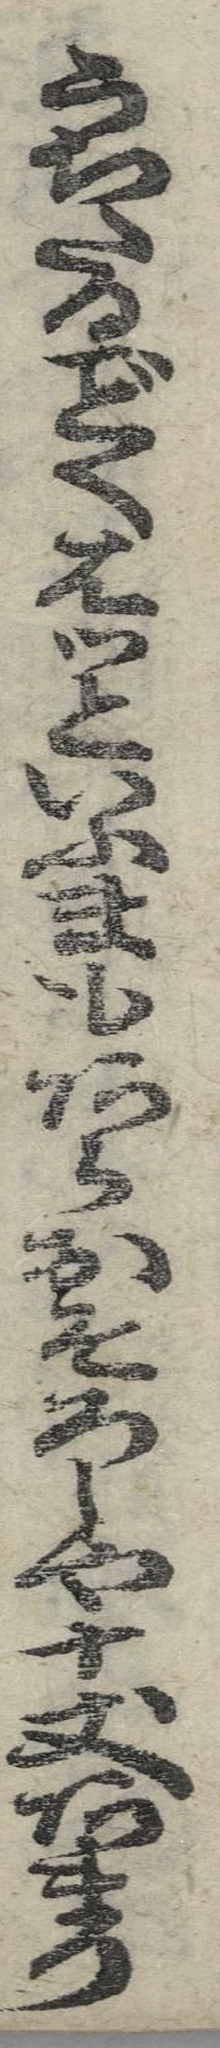うちたるごとくはつといふまもあらおそろしや十丈あまり
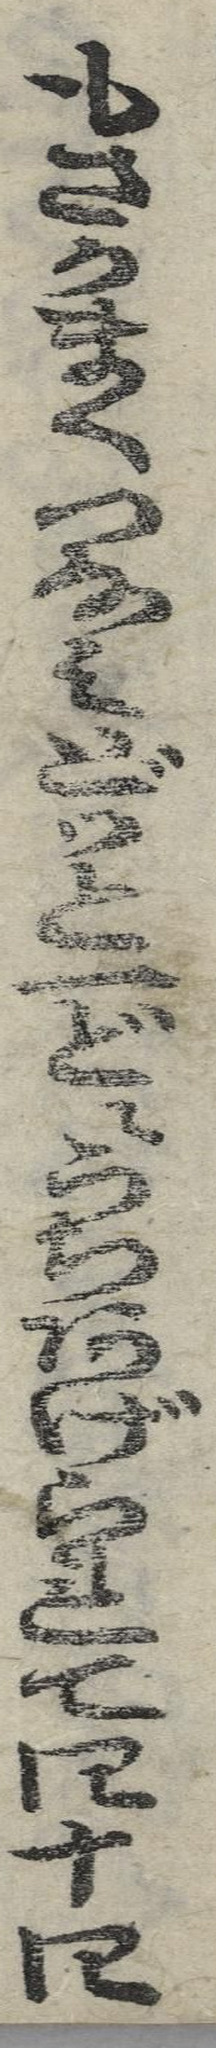もさかまくつなみどつと一どにうちあげられて四十四
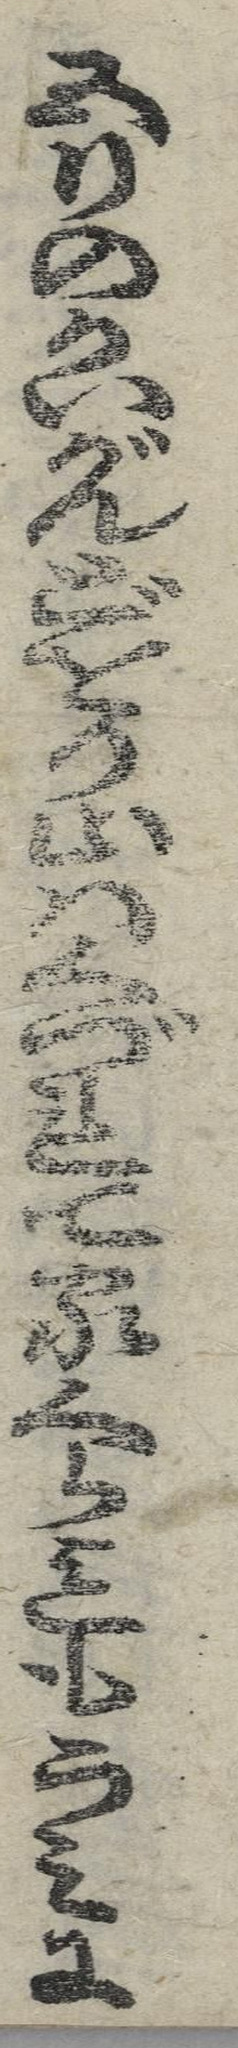五りのかいがんどをり山はくづれて家人ら迄もうみに
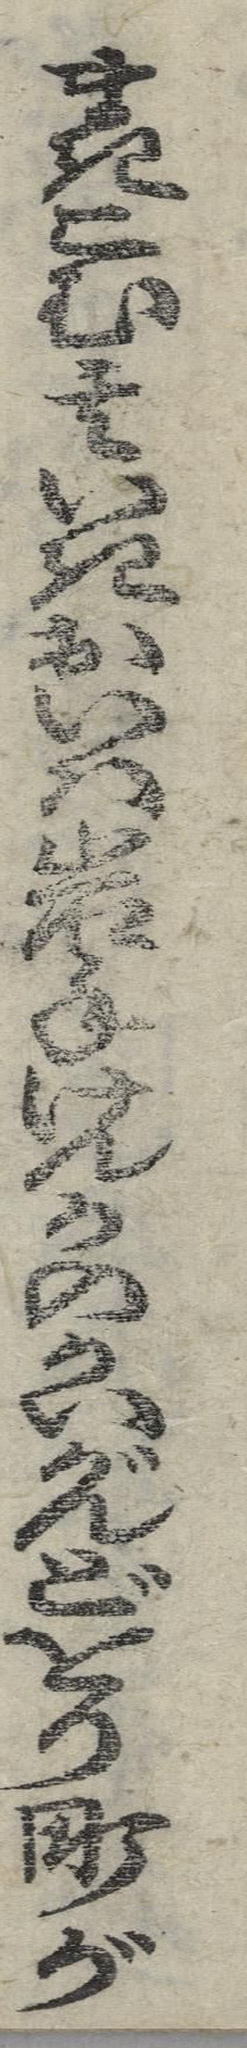まきこむ其いきおいは岩手けんかのかいがんどをり町が
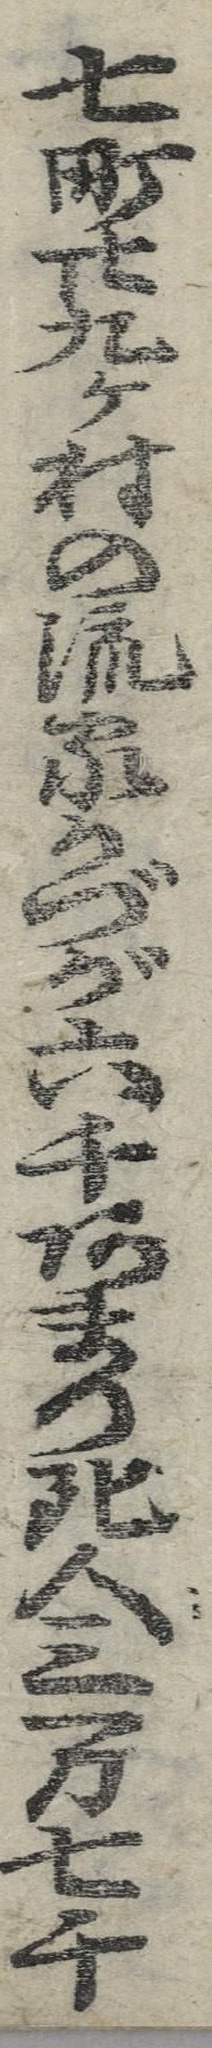七町廿九ヶ村の流家かづが六千あまり死人三万七千
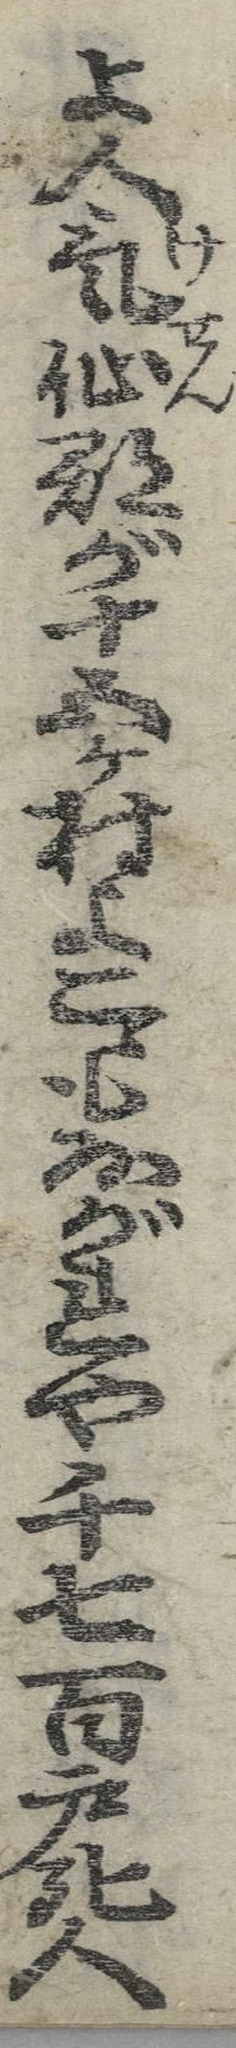よ人気仙郡が十五ヶ村よこゝもながれや千七百戸死人
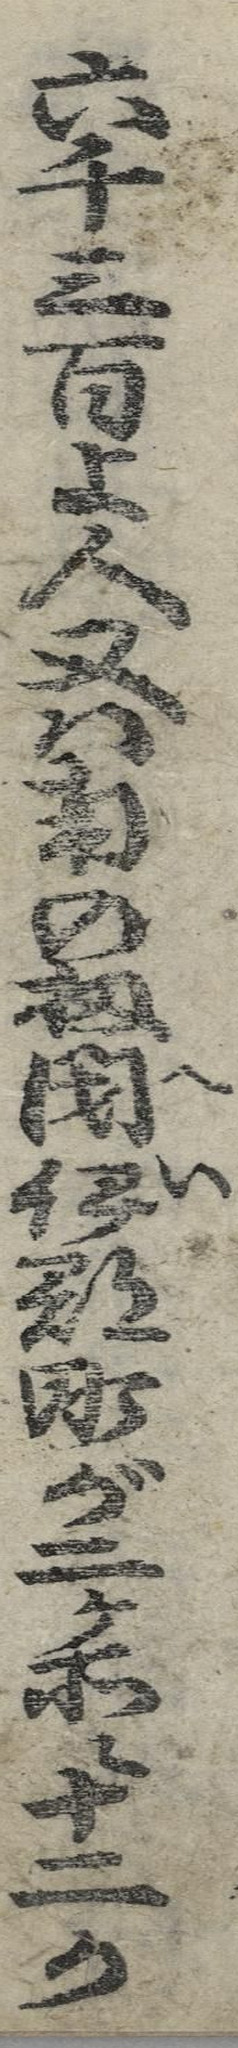六千三百よ人又は南の扨？閉伊郡町が二ヶ所に十二か
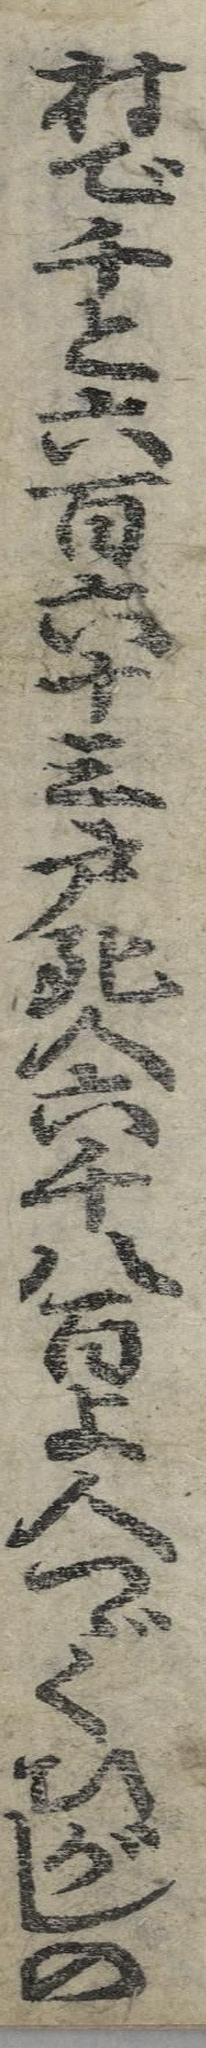村で千と六百六十三戸死人六千八百よ人つゞくひがしの
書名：奥州すじ大つなみおおあれくどき
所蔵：東京大学地震研究所図書室 Earthquake Research Institute Library, The University of Tokyo, JAPAN
